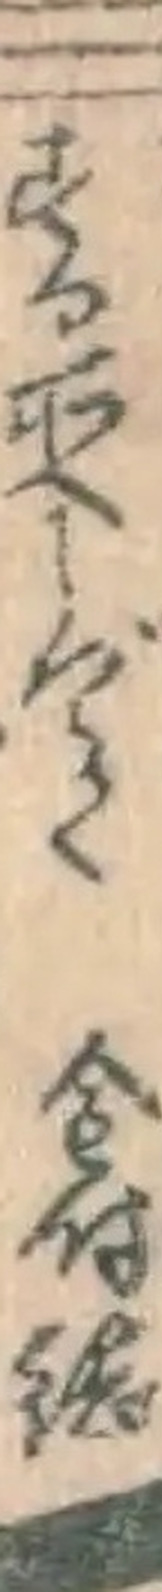する所へしづく金時綱
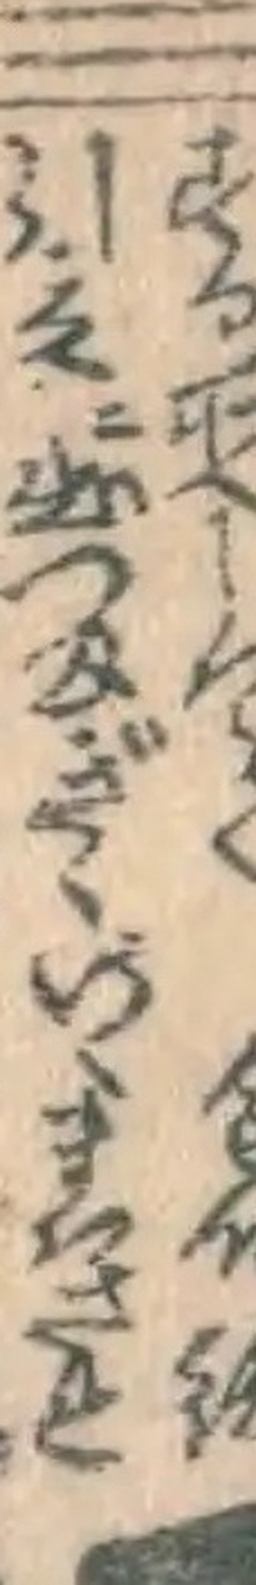引立に出つまぎくいゝまはされ
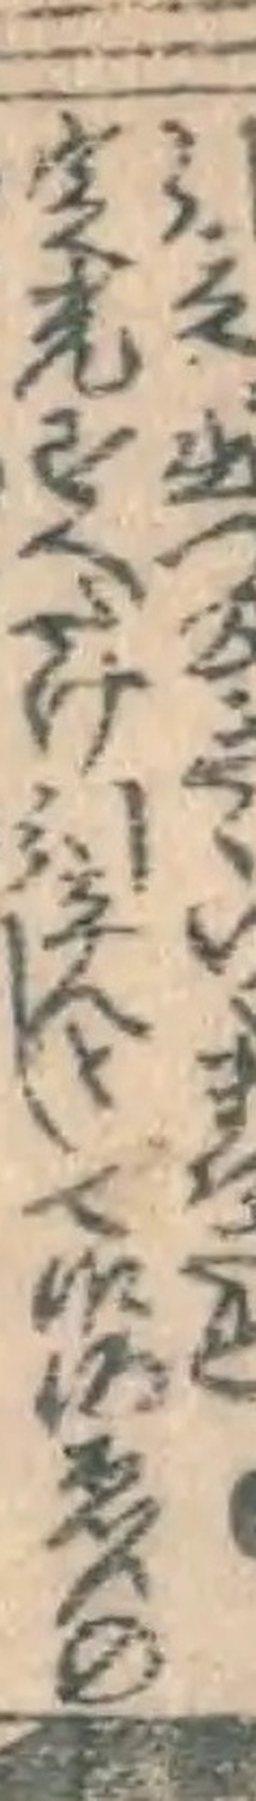定光すへたけ引立んとして御酒ゑんの
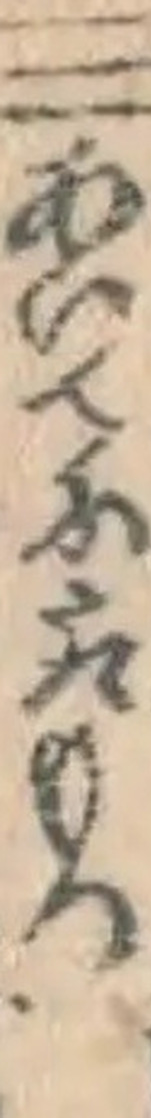あいてに取もつ
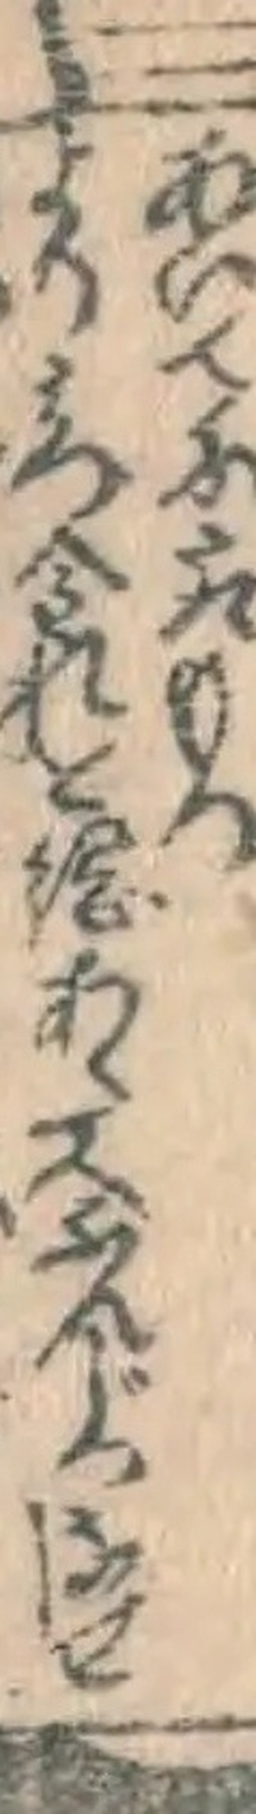よりみつ金札を綱あたへふんじつなせし
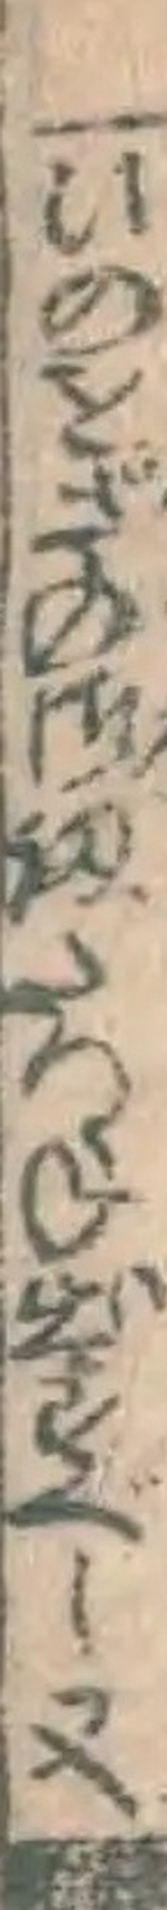ひのをざの御剣たづね出すべし又

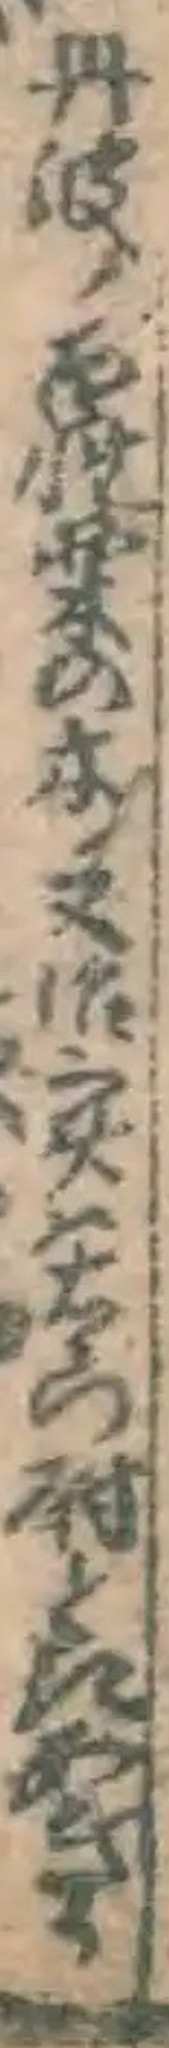丹波の百姓栗の木の又治実は右衛門尉ときあきら
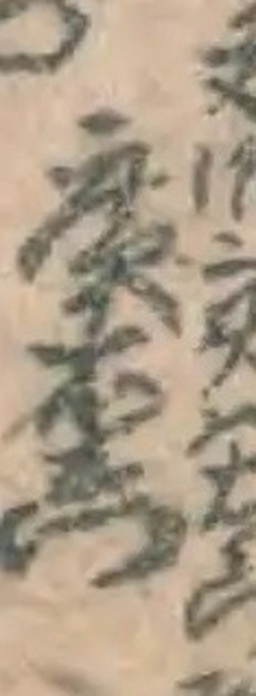広右衛門
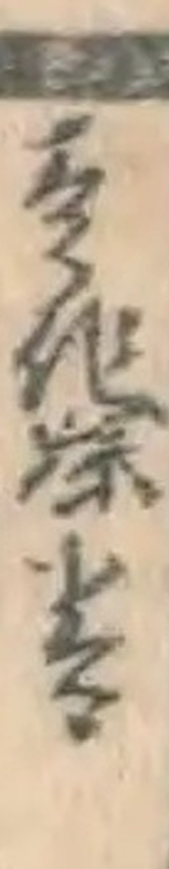太郎作妹
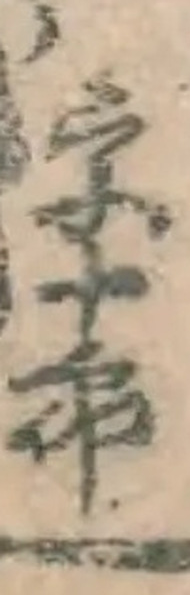宗十郎
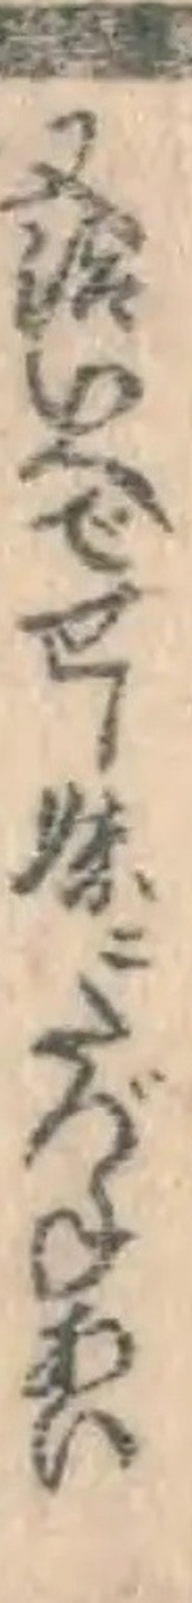又治いへでせし妹にたづねあい
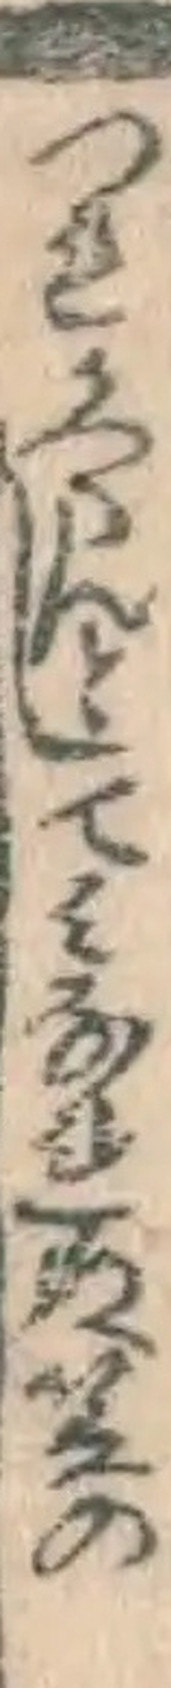つれかへらんとしてみなれぬ笠の
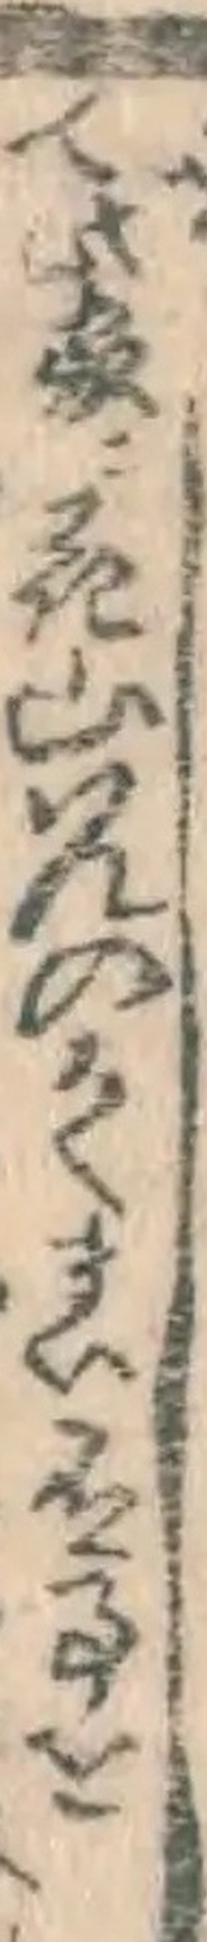て此家に花山いんのかくまい有事を
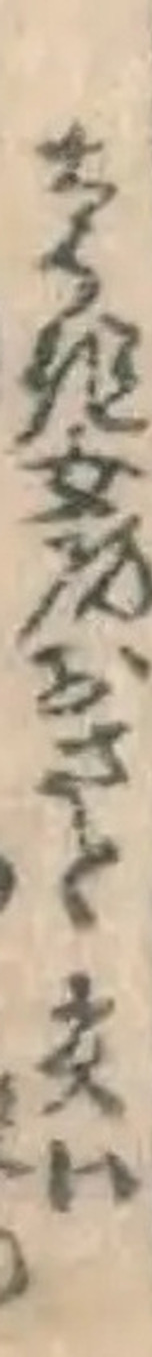太郎作女房おさと実は
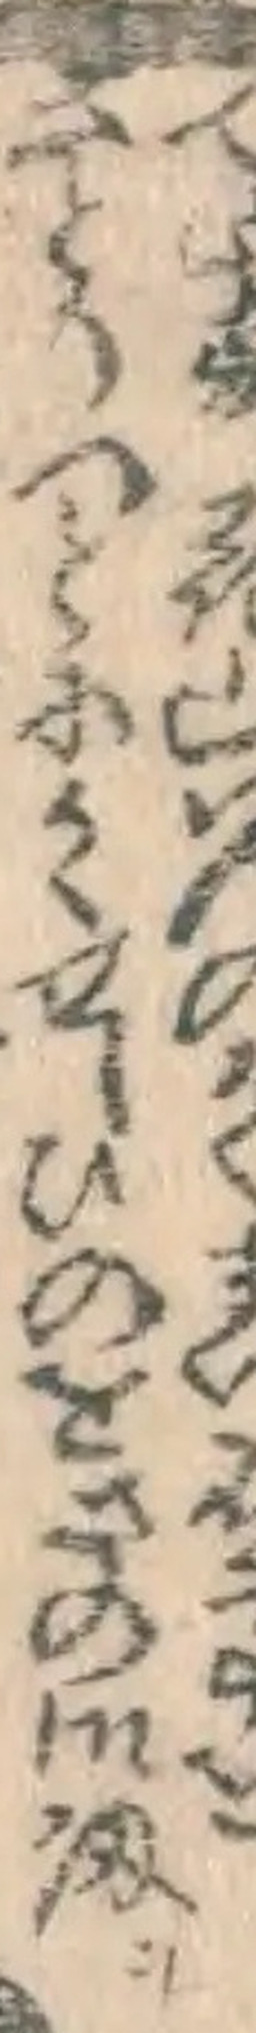さとりつとにかくせしひのをさの御剣を
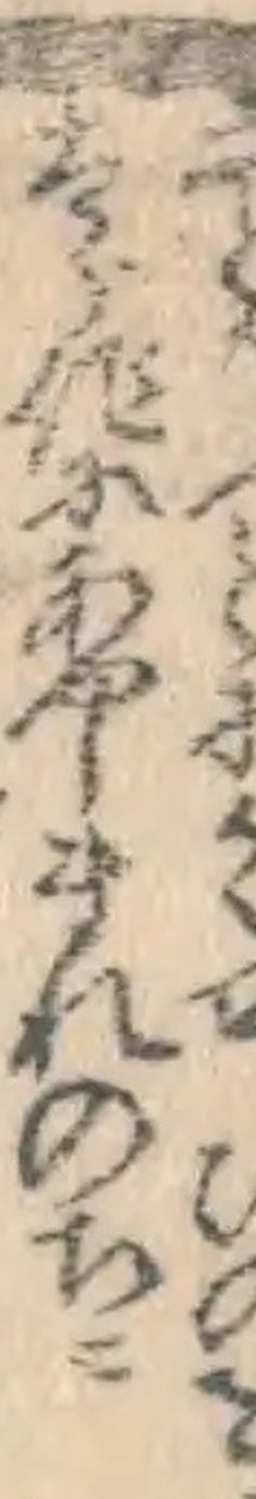太郎作にあやしまれのちに
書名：四天王宿直着綿
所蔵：国立国会図書館 National Diet Library, JAPAN
